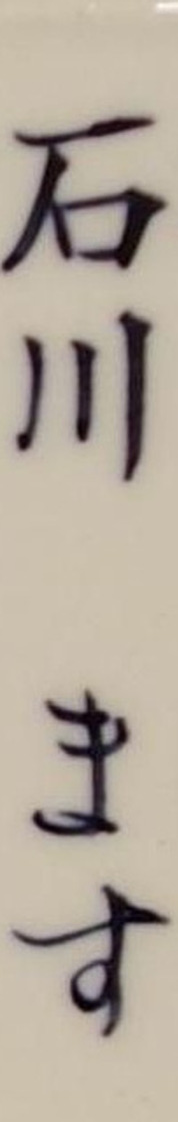石川ます
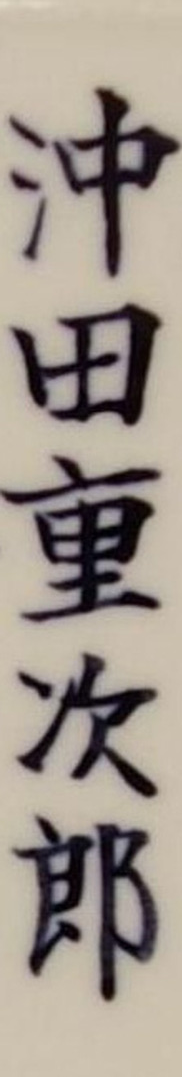沖田重次郎
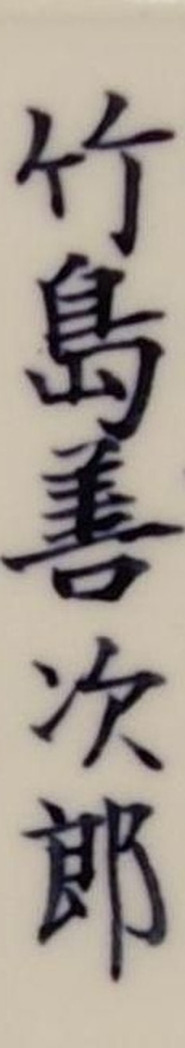竹島善次郎
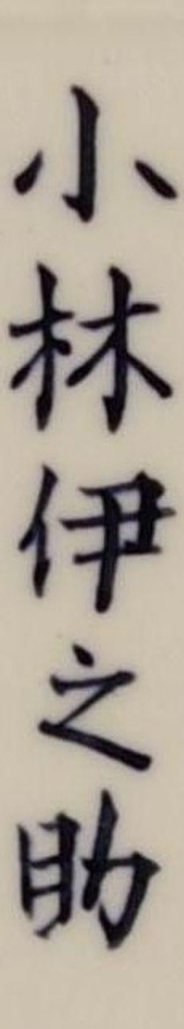小林伊之助
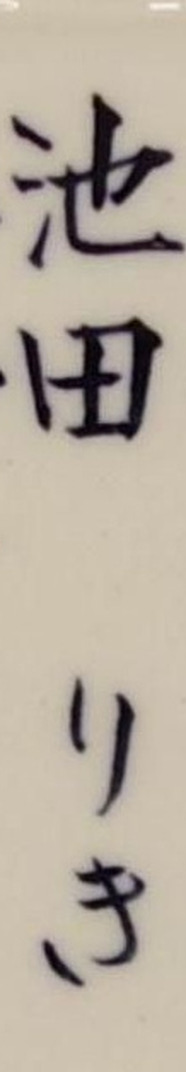池田りき
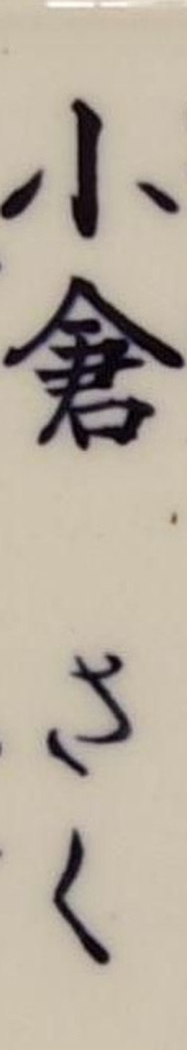小倉さく
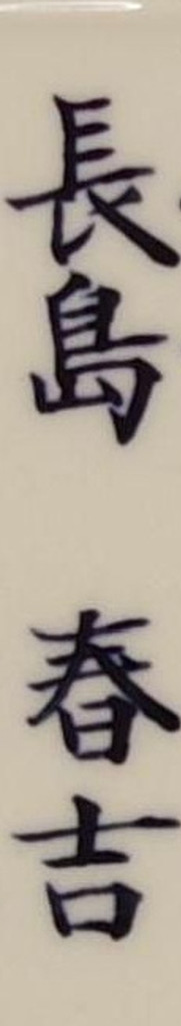長島春吉
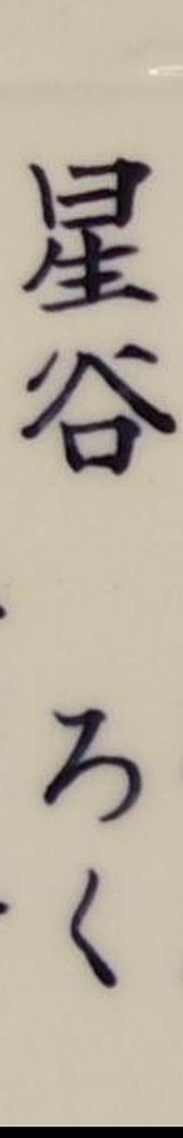星谷ろく
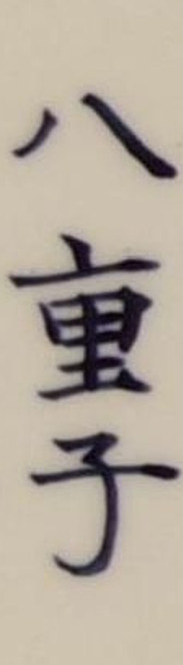八重子
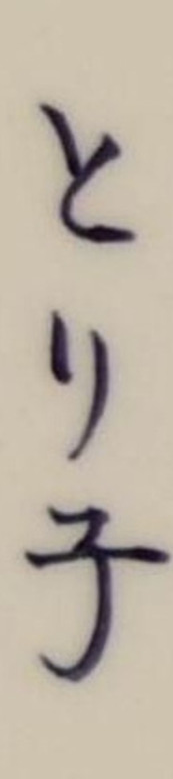とり子
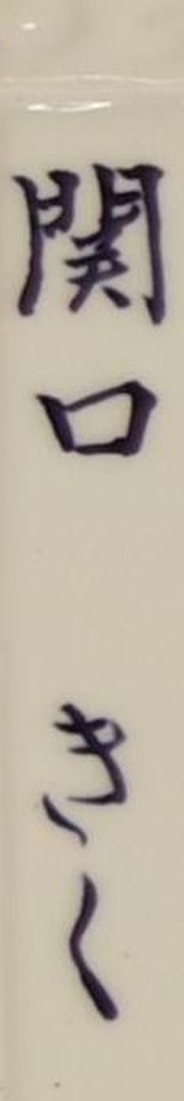関口きく

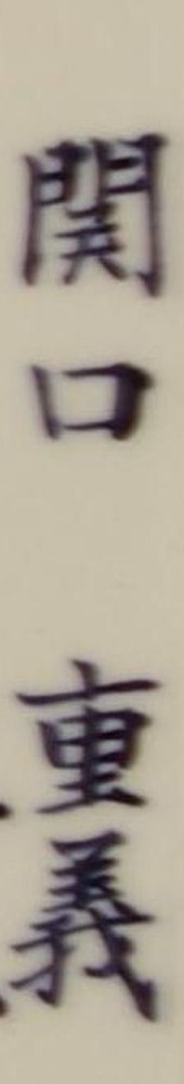関口重義
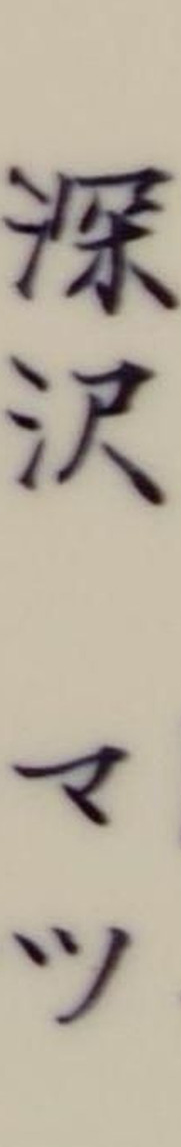深沢マツ
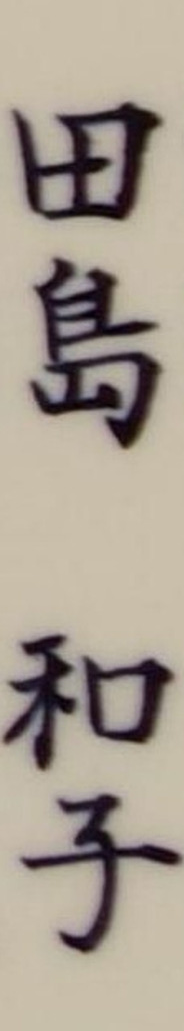田島和子
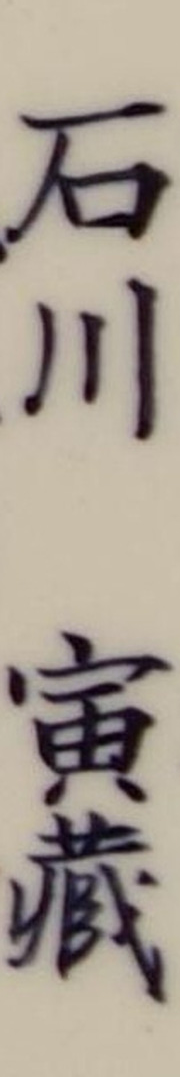石川寅蔵
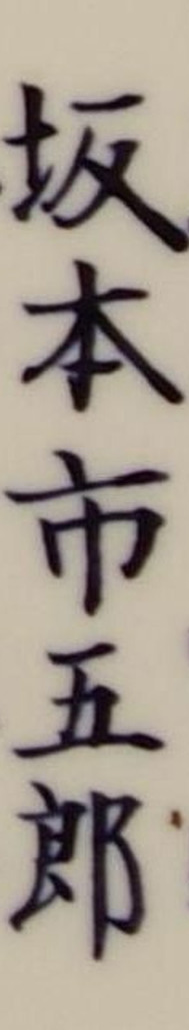坂本市五郎
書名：M~S
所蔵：高野山金剛峯寺
